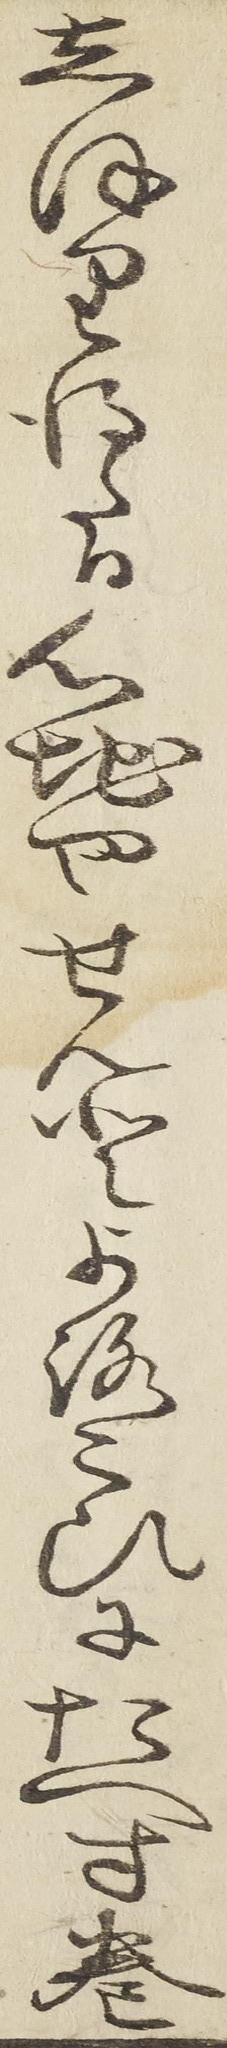しほり得たる心地やせんとよろこひにたへす巻
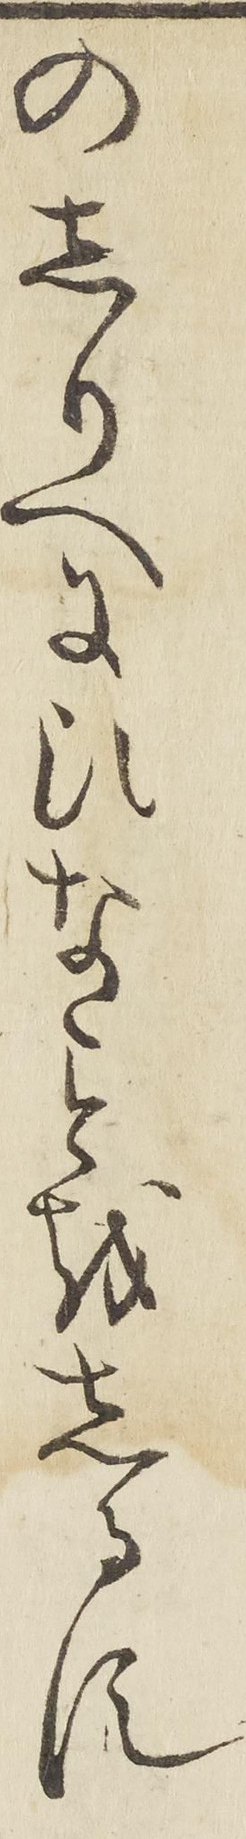のしりへにひなことをしるす
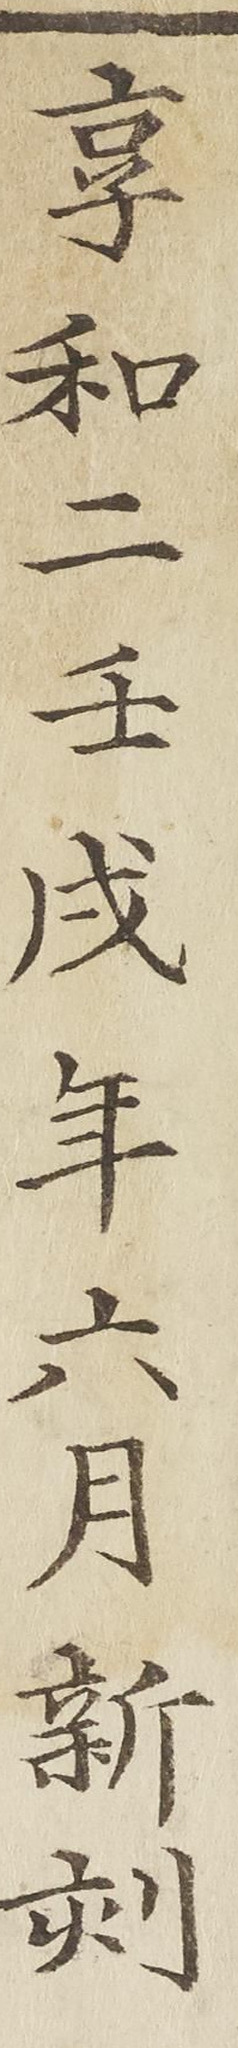享和二壬戌年六月新刻
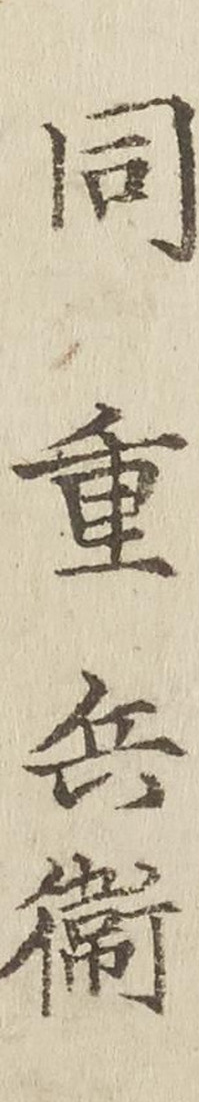同重兵衛
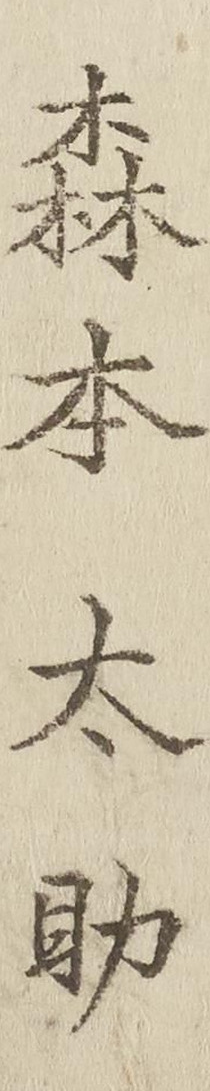森本太助
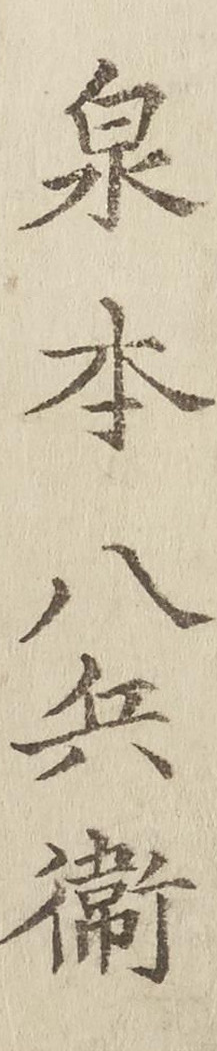泉元八兵衛
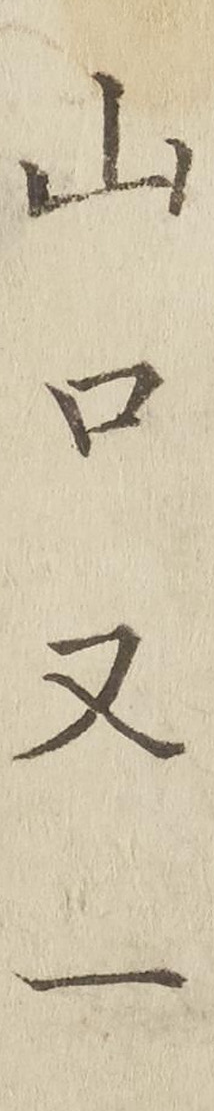山口又一
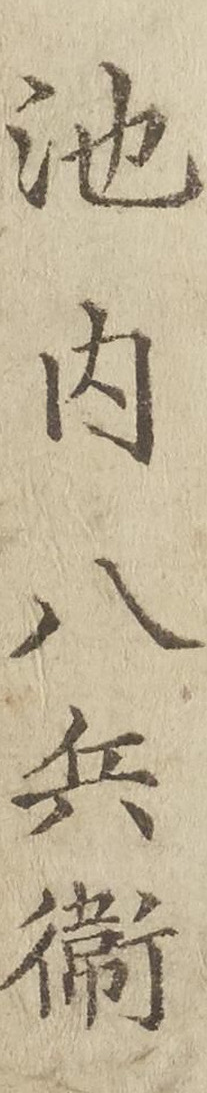池内八兵衛
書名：平天儀圖解
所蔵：東京大学地震研究所図書室 Earthquake Research Institute Library, The University of Tokyo, JAPAN
